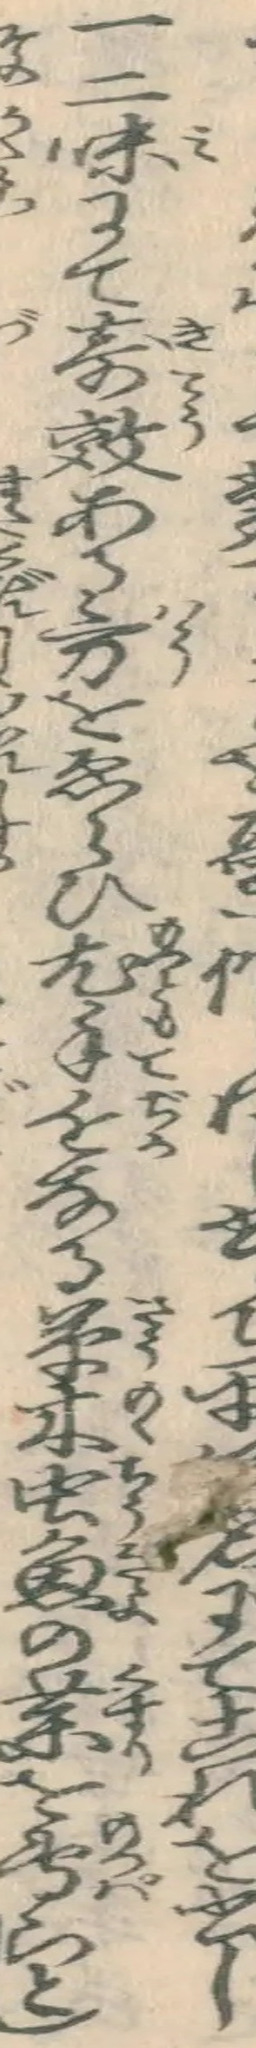一二味にて奇効ある方をゑらひ尤手近なる草木虫魚の薬を専らとし
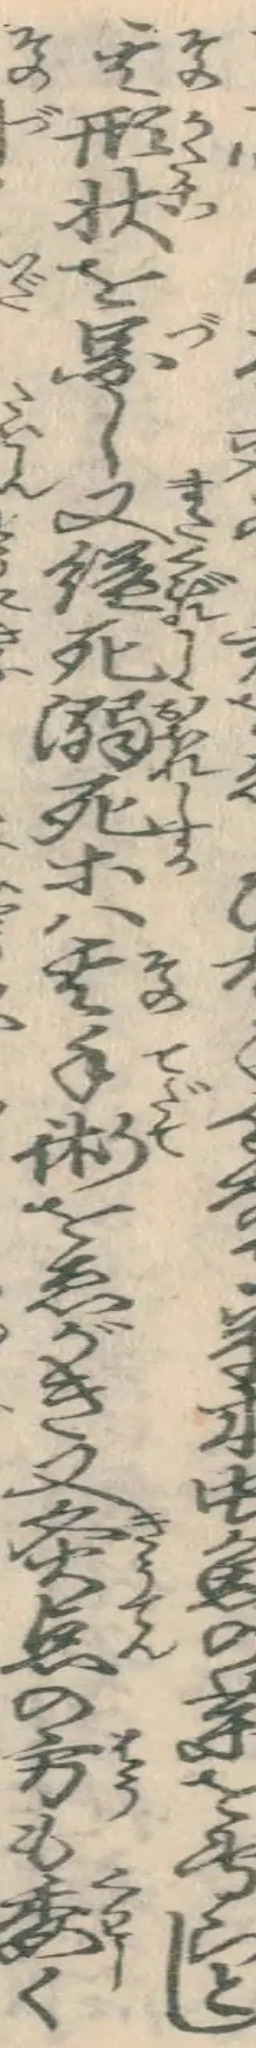其形状を図し又縊死溺死等は其手術をゑがき又灸点の方も委く
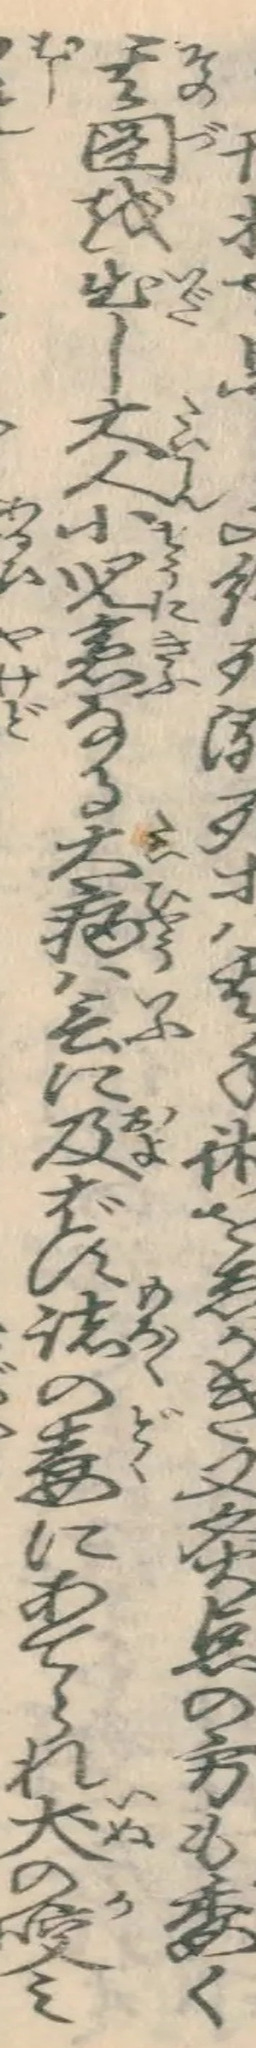其図を出し大人小児急なる大病は云に及ばす諸の毒にあてられ犬の咬み
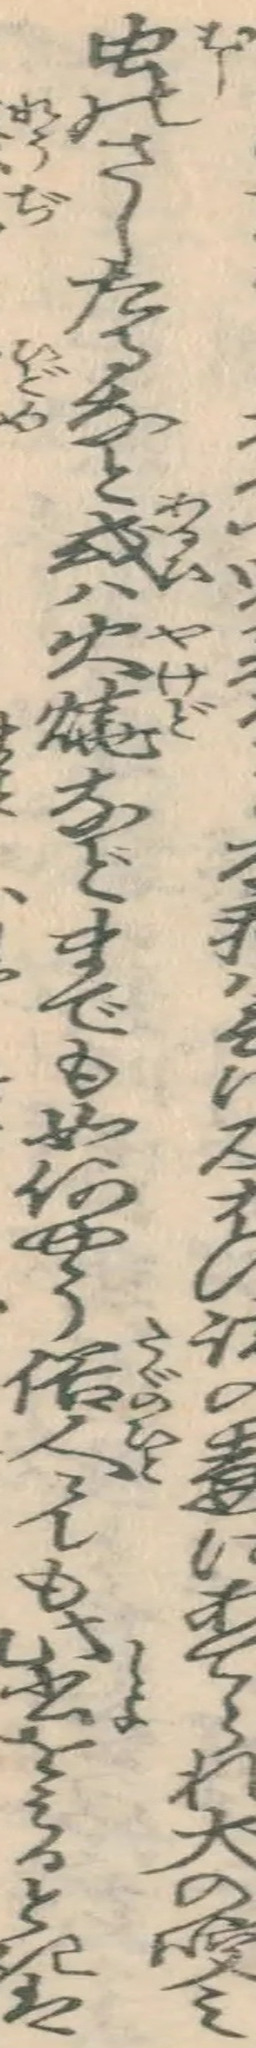虫のさしたるなと或は火焼などまでも如何やう俗人にても此書をみるときは
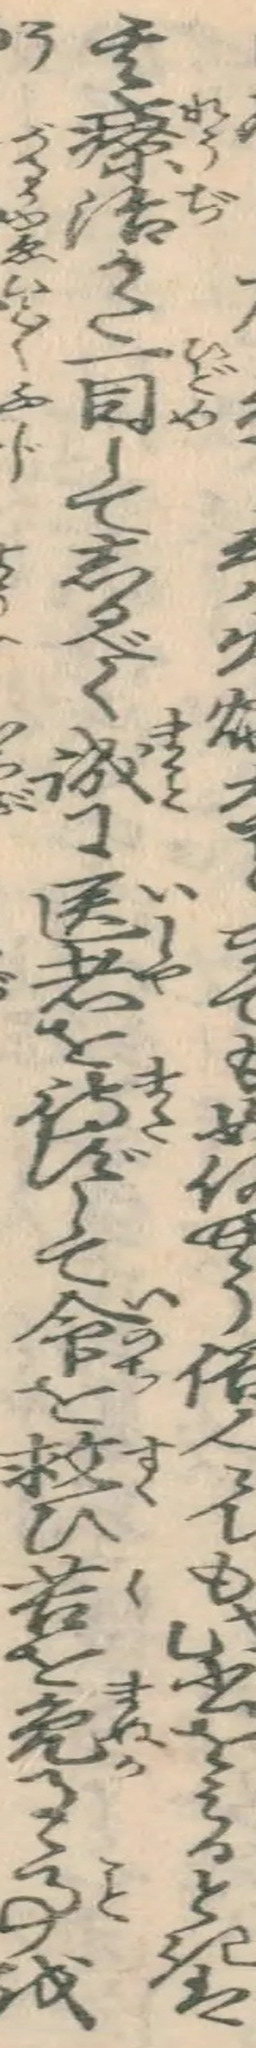其療治かた一目してしるべく誠に医者を待ずして命を救ひ苦を免るゝ事を
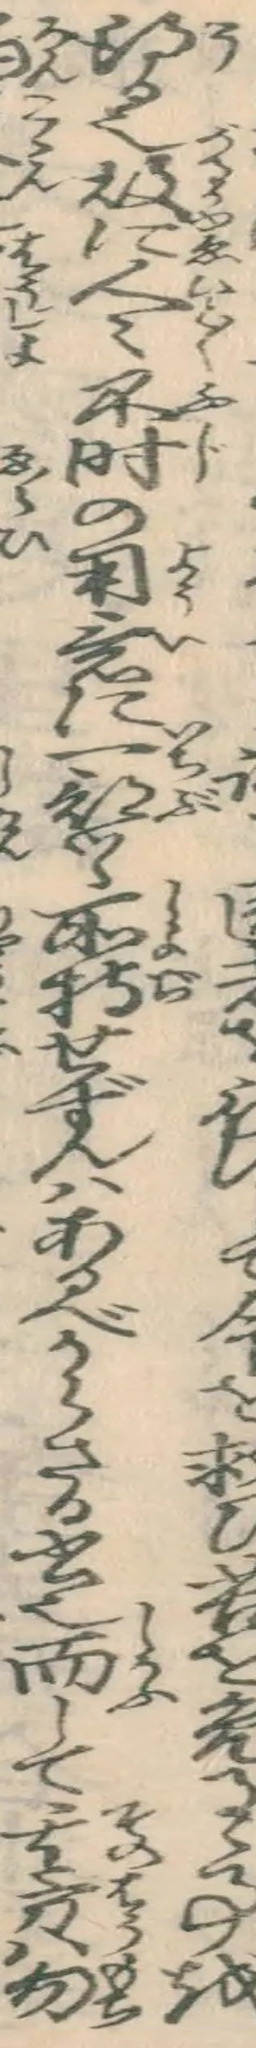得る也故に人々不時の用意に一部つゝ所持せずんはあるべからさる書也而して其方は勿
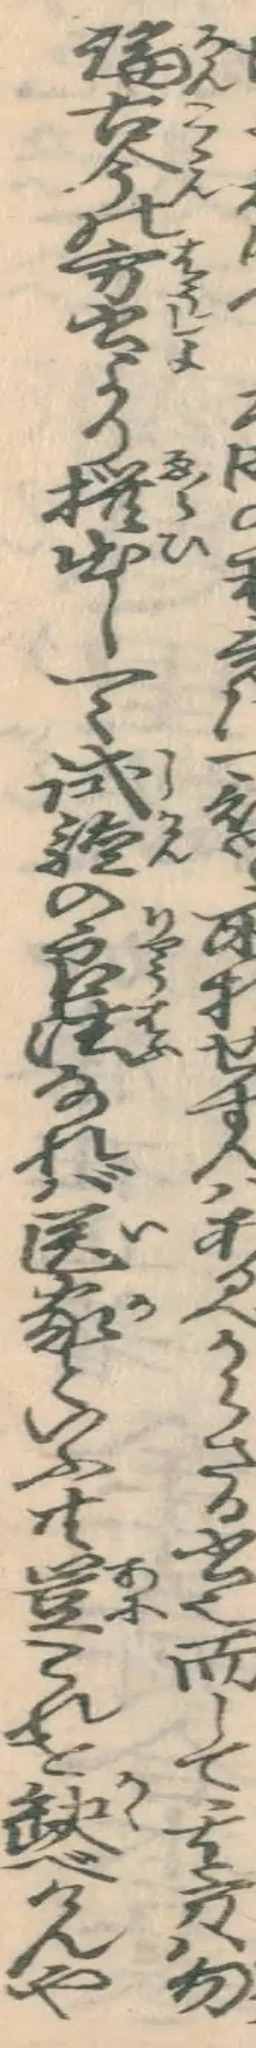論古今の方書より撰出して試験の良法なれば医家といふ共豈これを缺べけんや
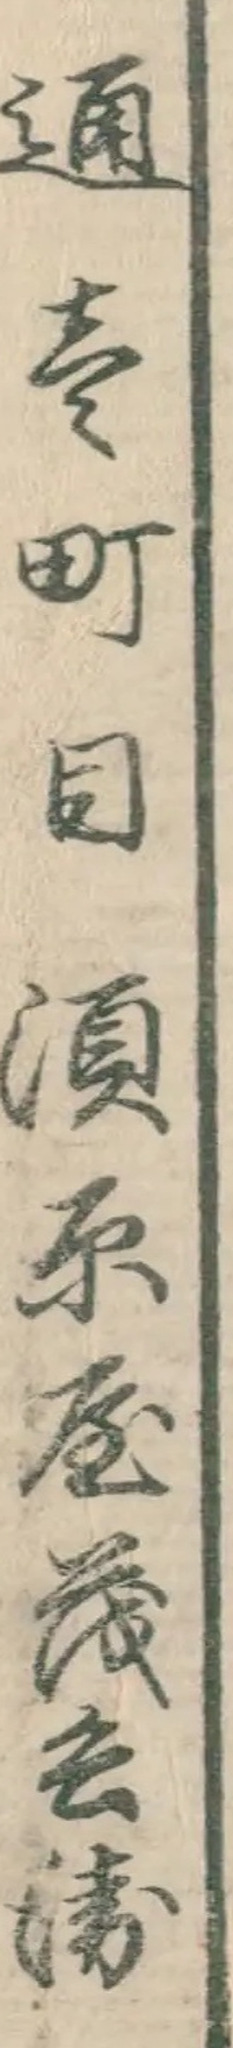通壱町目須原屋茂兵衛
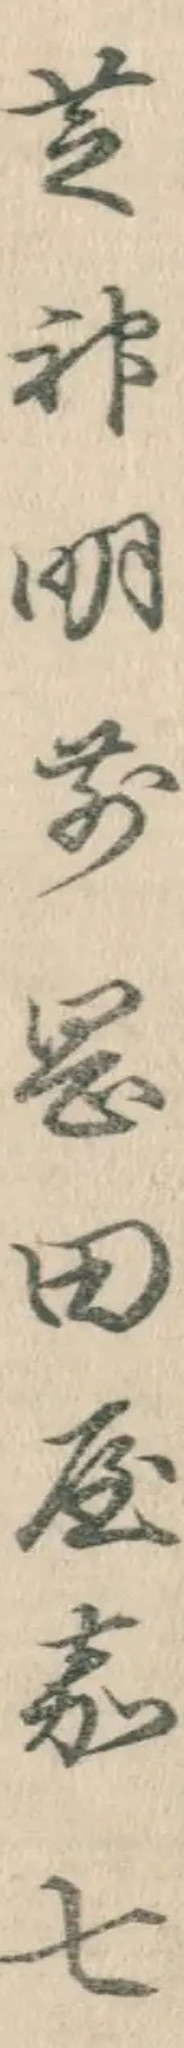芝神明前岡田屋嘉七
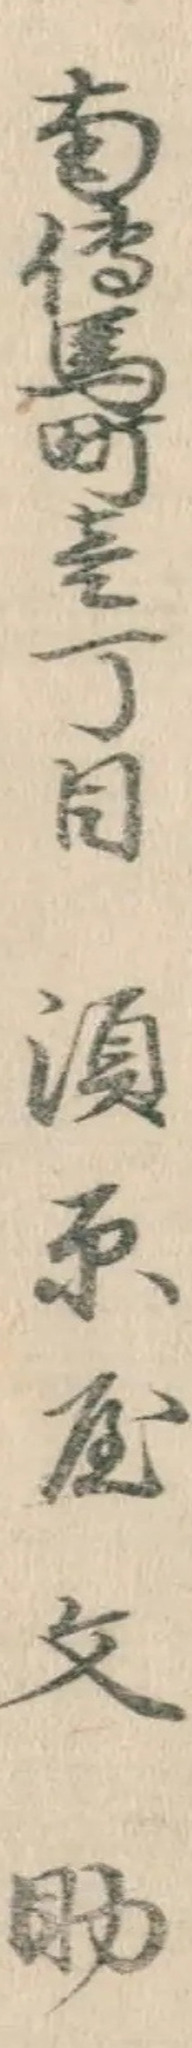南伝馬町壱丁目須原屋文助
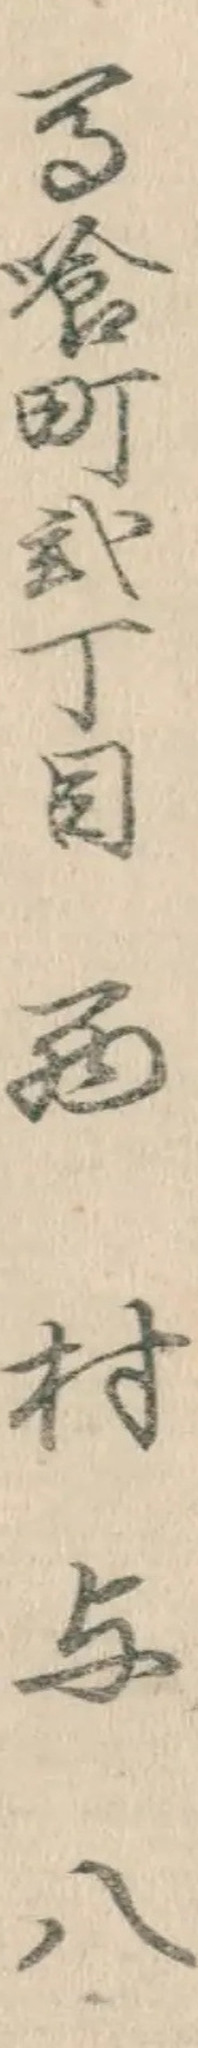馬喰町弐丁目西村与八
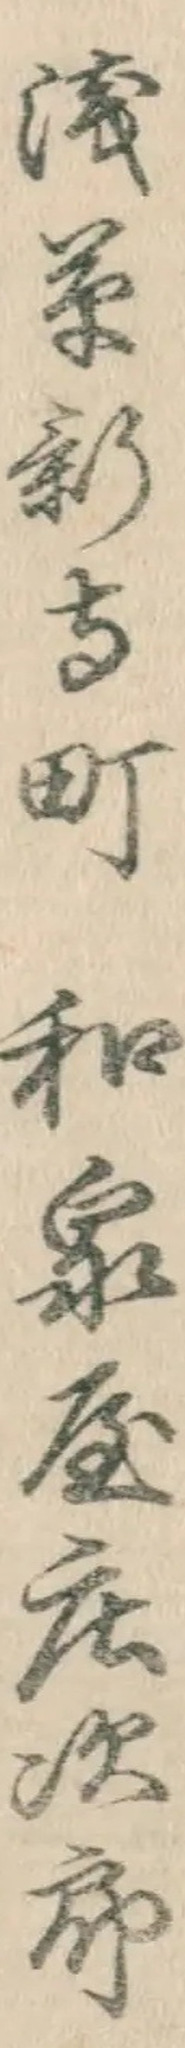浅草新寺町和泉屋庄次郎
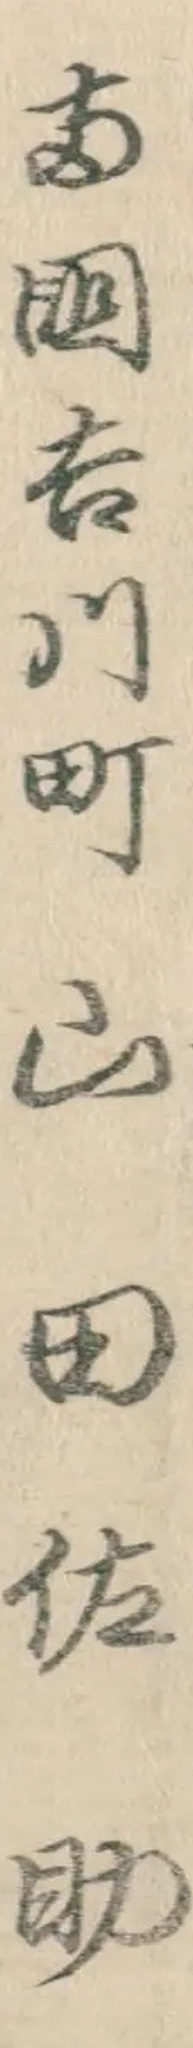両国吉川町山田佐助
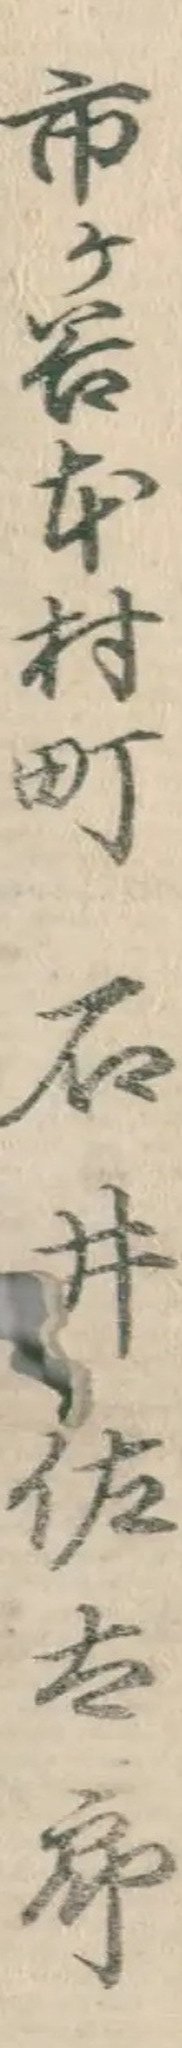市ヶ谷本村町石井佐太郎
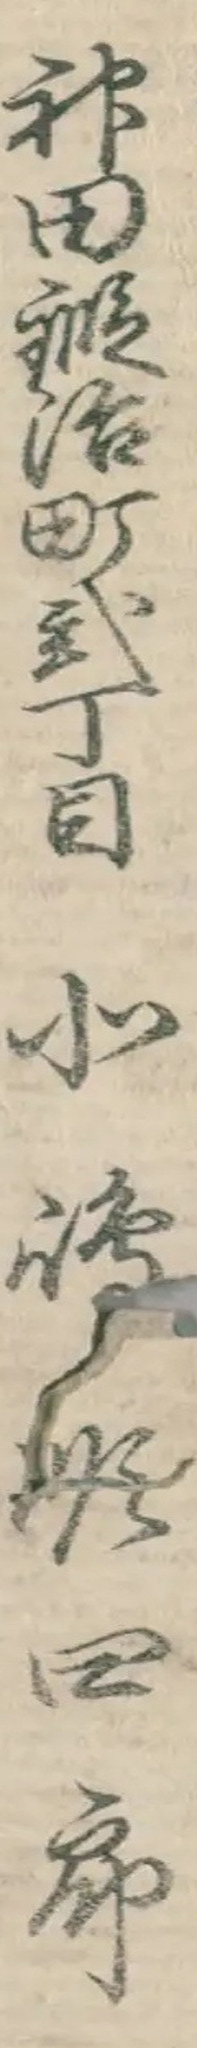神田鍛冶町弐丁目北島順四郎
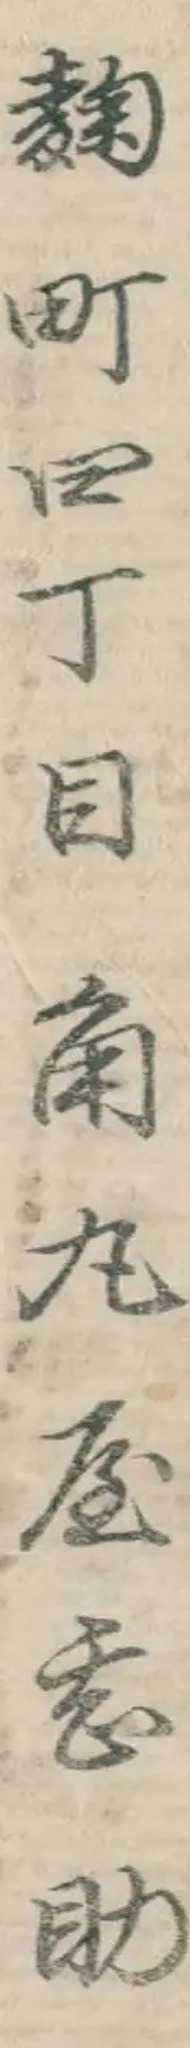麹町四丁目角丸屋甚助
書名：経済をしへ草
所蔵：国立国会図書館 National Diet Library, JAPAN
